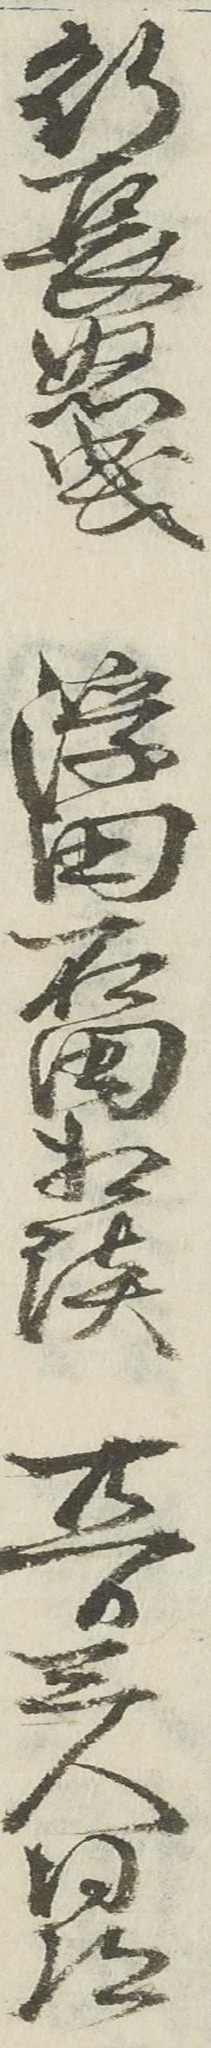行長怒曳浮田石田相談廿一日三人同道
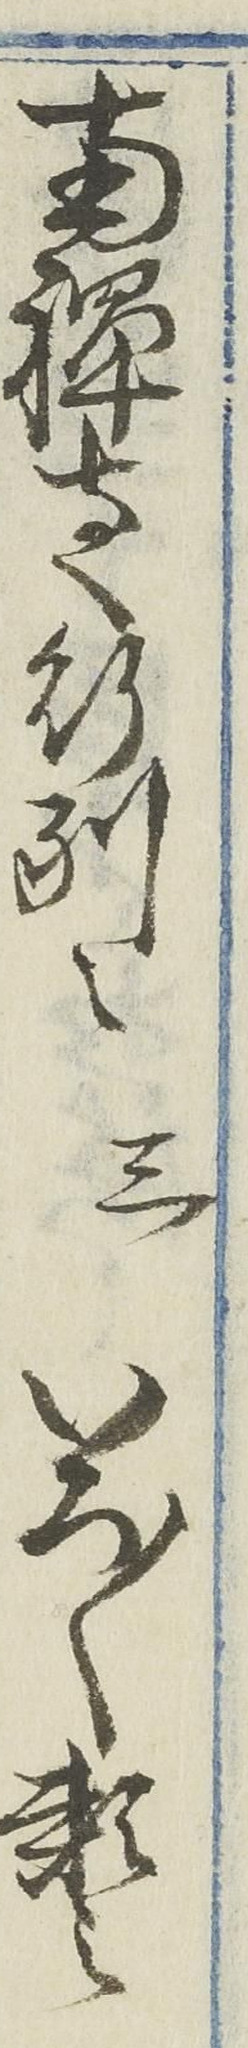南禅寺ヘ行列の？三いろ〳〵頼之
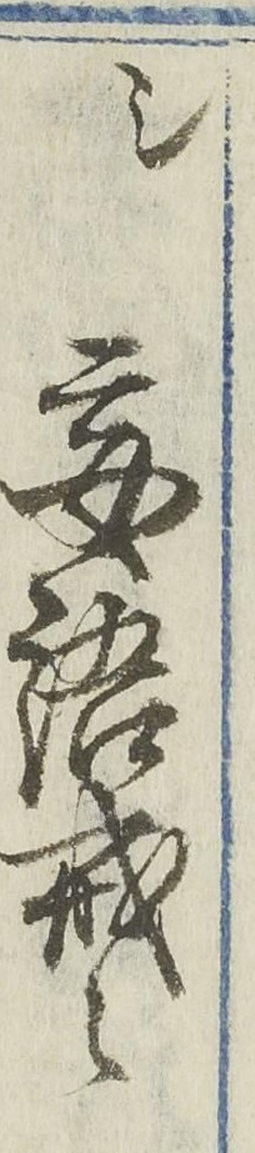シ妄語戒也
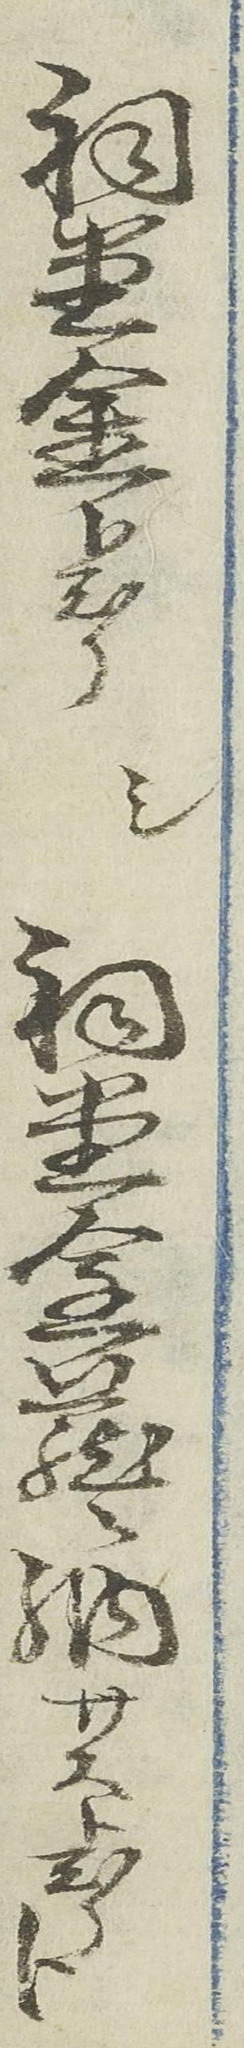三祠堂金ト云ウシ祠堂金蔵ニ納サスト云ウト

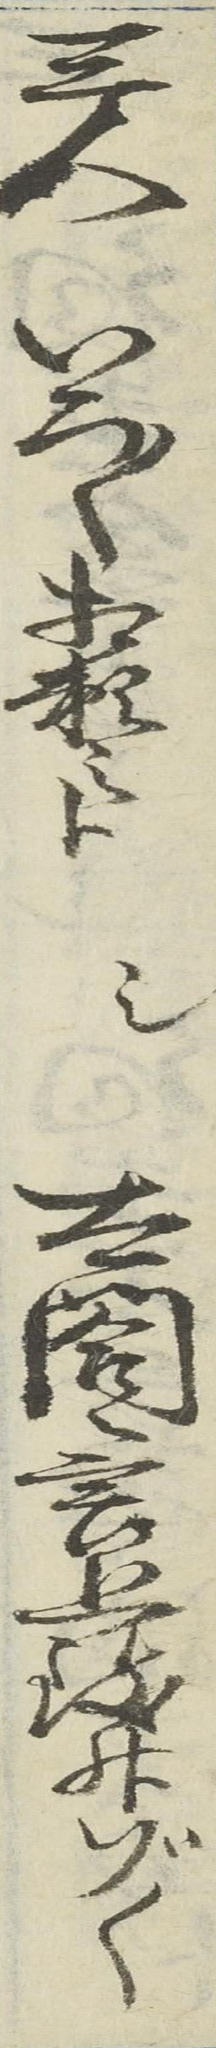三人いろ〳〵相頼之トシ太閤ニ言上致升ゾ〳〵
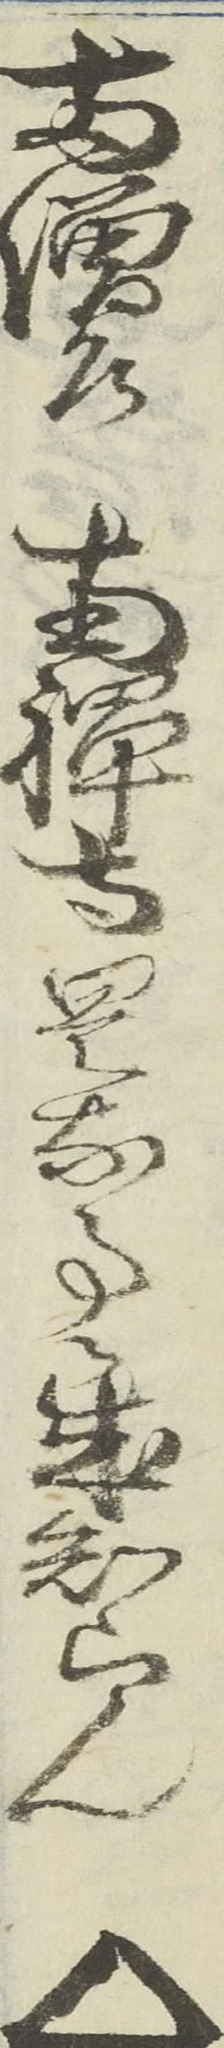両僧乍南禅寺是な事ニ成知らん△
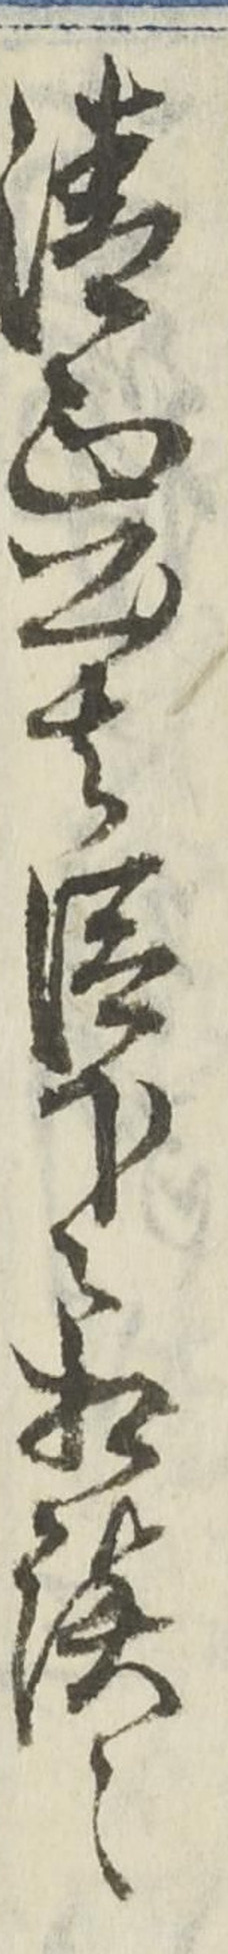清正公は臣下ニ相談シ
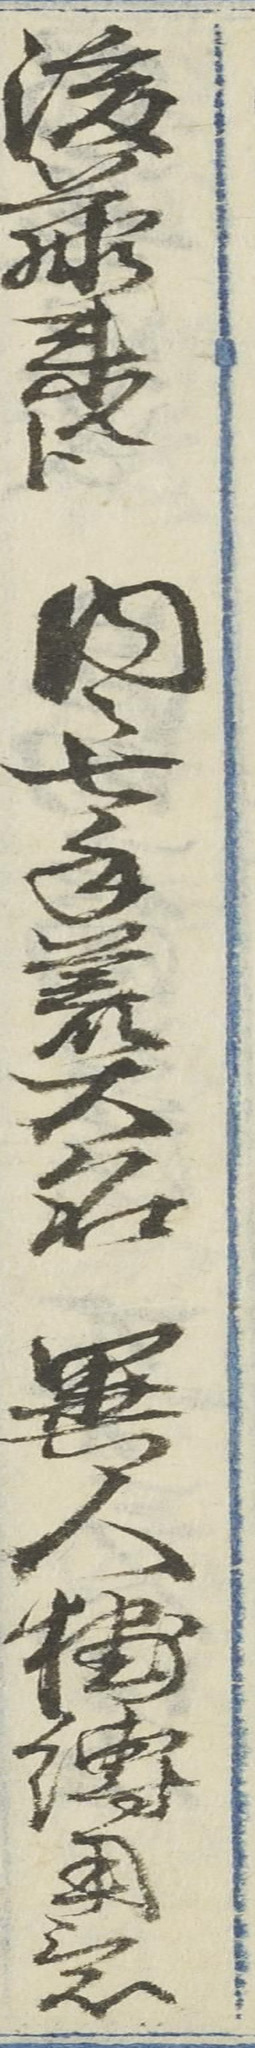後藤来ルト内〻七手荒大名異人捕縛用意
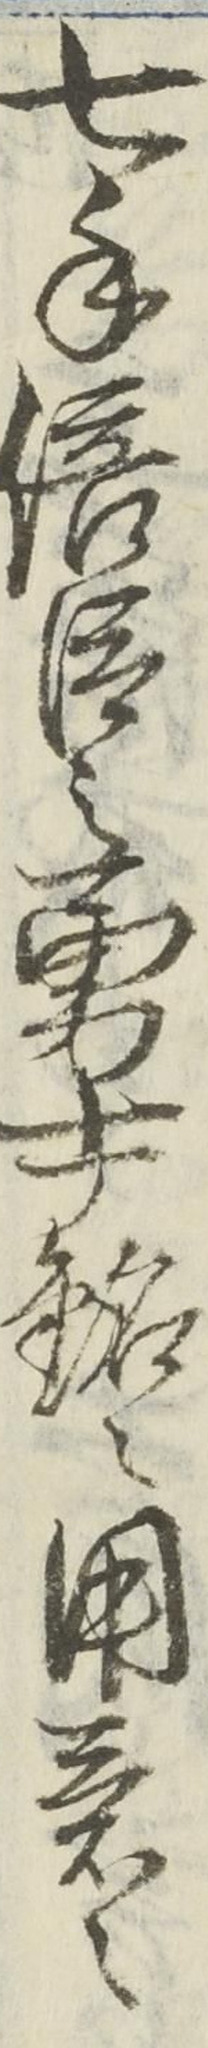七手倍臣之勇士ノ銘ニ用意也
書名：伏水大地震
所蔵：東京大学地震研究所図書室 Earthquake Research Institute Library, The University of Tokyo, JAPAN
